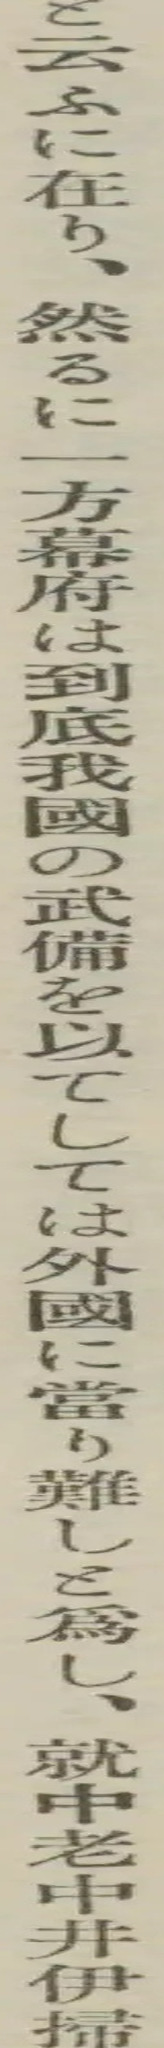と云ふに在り、然るに一方幕府は到底我国の武備を以てしては外国に当り難しと為し、就中老中井伊掃
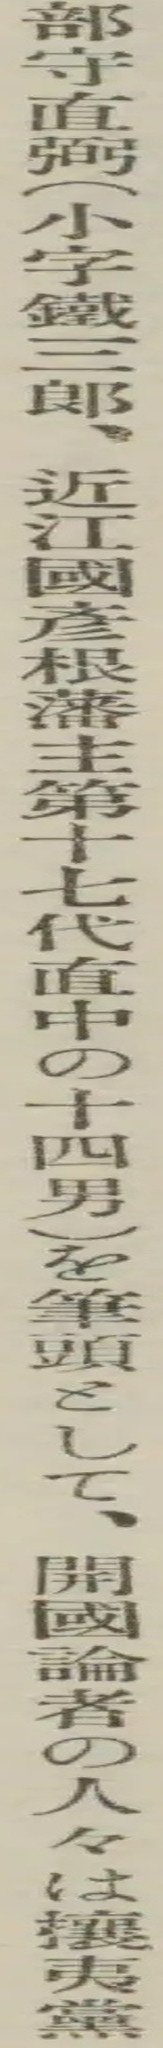部守直弼(小字鐵三郎、近江国彦根藩主第十七代直中の十四男)を筆頭として、開国論者の人々は攘夷党
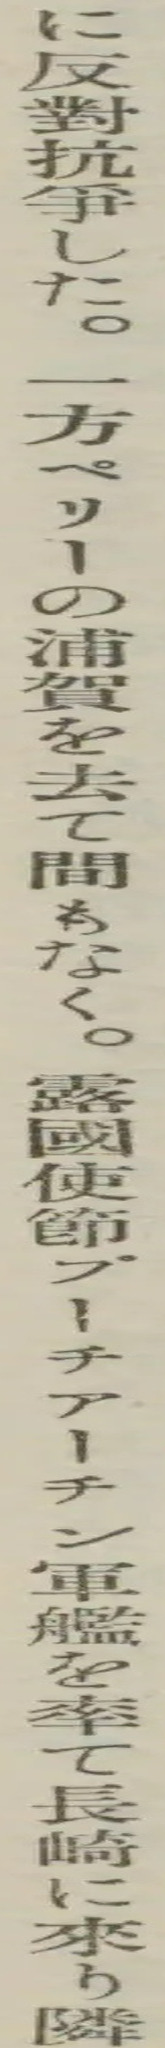に反対抗争した。一方ペリーの浦賀を去て間もなく。露国使節プーチアーチン軍艦を率て長崎に来り隣
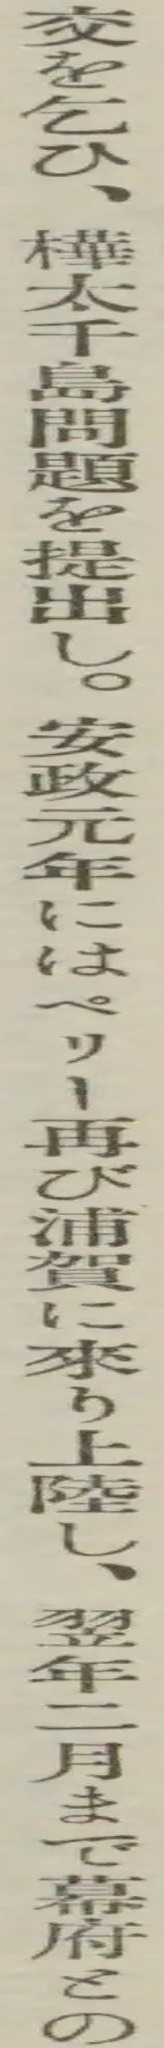交を乞ひ、樺太千島問題を提出し。安政元年にはペリー再び浦賀に来り上陸し、翌年二月まで幕府との
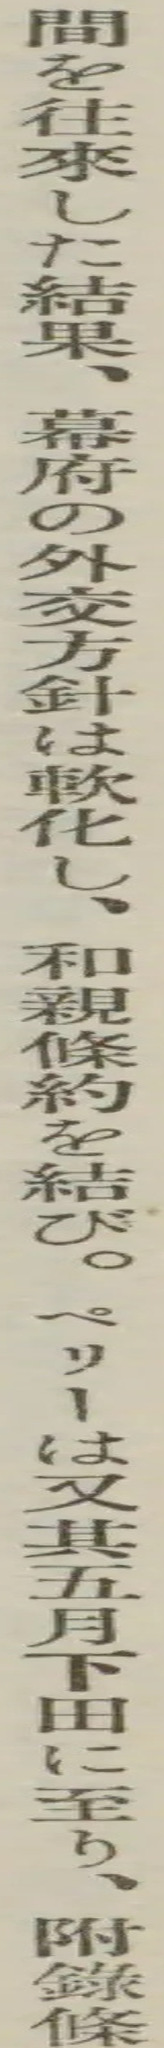間を往来した結果、幕府の外交方針は軟化し、和親条約を結び。ペリーは又其五月下田に至り、附録条
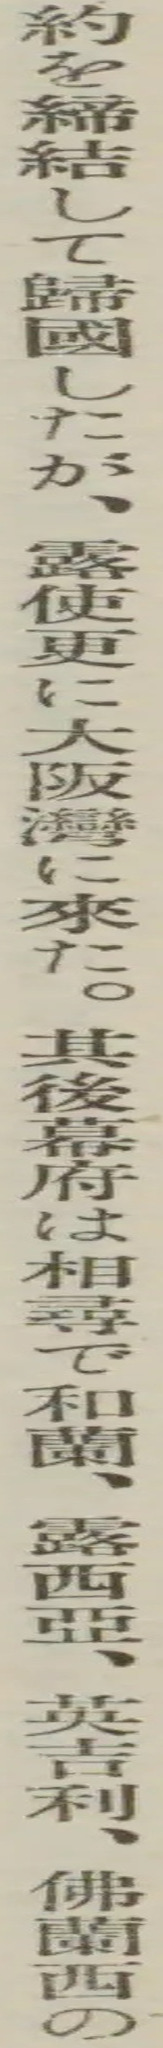約を締結して帰国したが、露使更に大阪湾に来た。其後幕府は相尋で和蘭、露西亜、英吉利、仏蘭西の
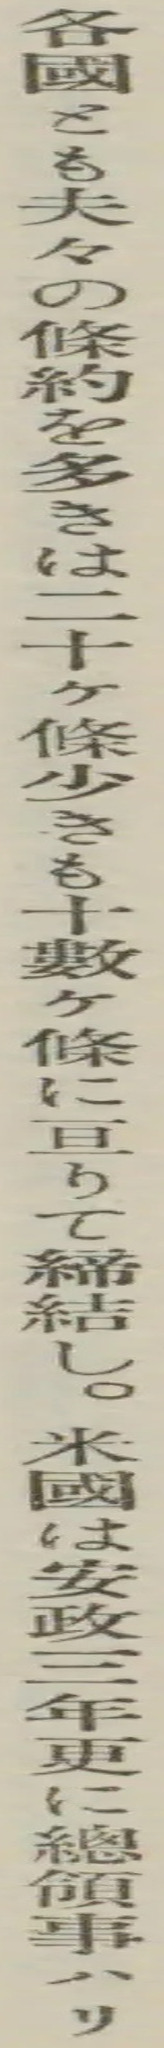各国とも夫々の条約を多きは二十ケ条少きも十数ケ条に亘りて締結し。米国は安政三年更に総領事ハリ
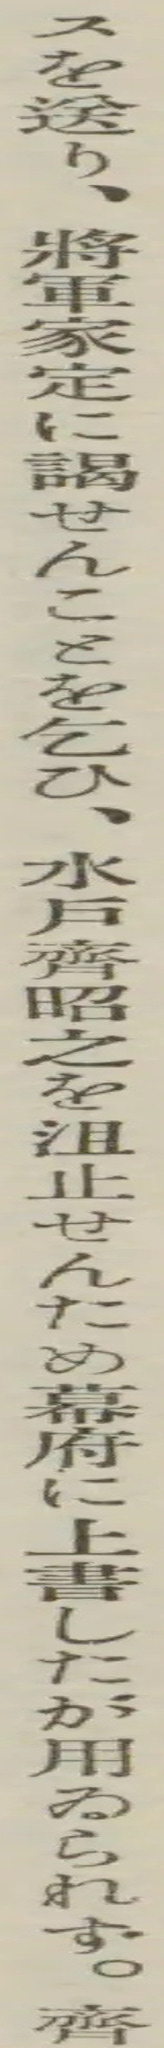スを送り、将軍家定に謁せんことを乞ひ、水戸齊昭之を沮止せんため幕府に上書したが用ゐられず。齊
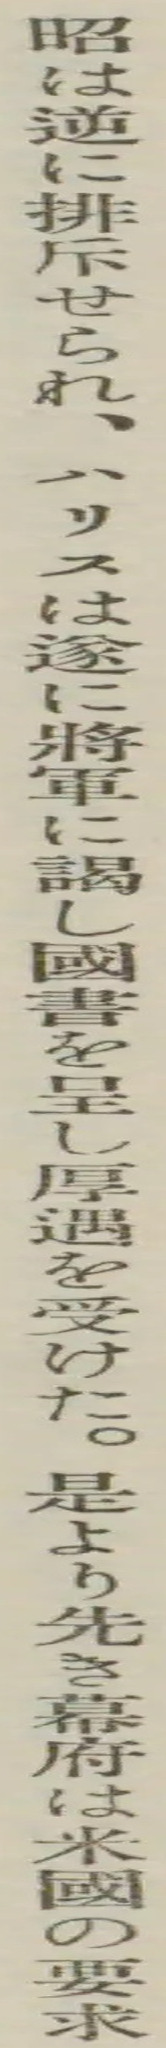昭は逆に排斥せられ、ハリスは遂に将軍に謁し国書を呈し厚遇を受けた。是より先き幕府は米国の要求
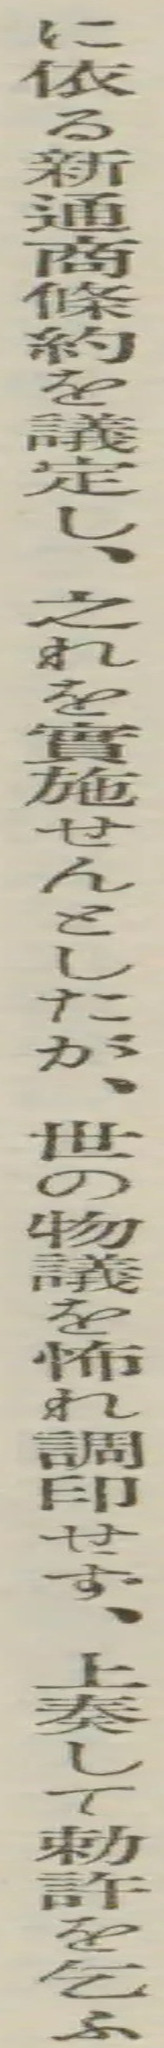に依る新通商条約を議定し、之れを実践せんとしたが、世の物議を怖れ調印せず、上奏して勅許を乞ふ
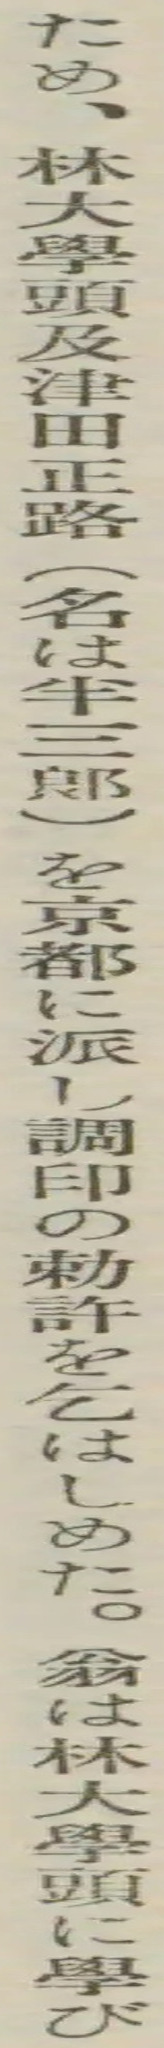ため、林大学頭及津田正路(名は半三郎)を京都に派し調印の勅許を乞はしめた。翁は林大学頭に学び
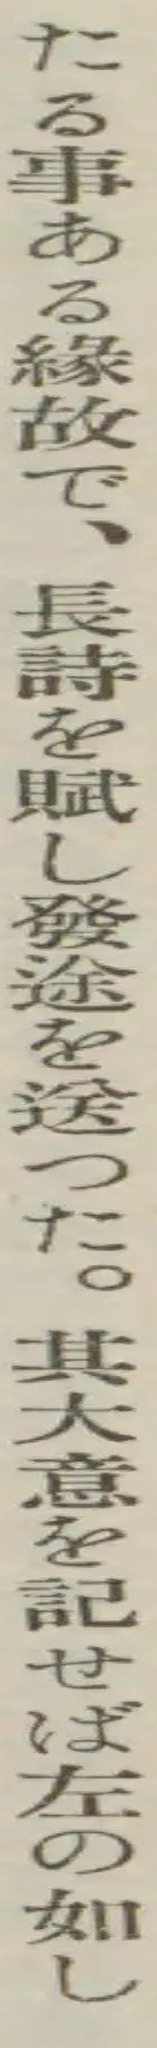たる事ある縁故で、長詩を賦し発途を送つた。其大意を記せば左の如し
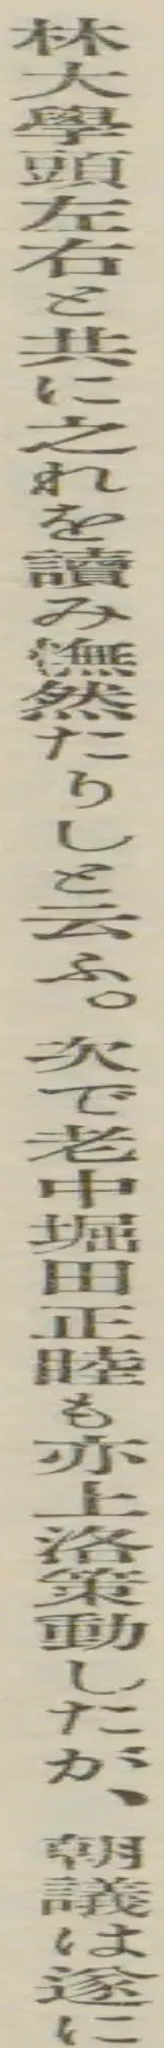林大学頭左右と共に之れを読み憮然たりしと云ふ。次で老中堀田正睦も亦上洛策動したが、朝議は遂に

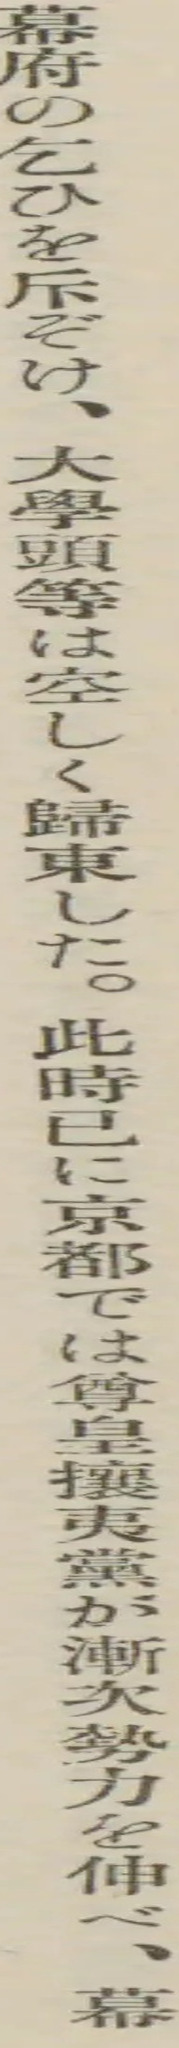幕府の乞ひを斥ぞけ、大学頭等は空しく帰東した。此時已に京都では尊皇攘夷党が漸次勢力を伸べ、幕
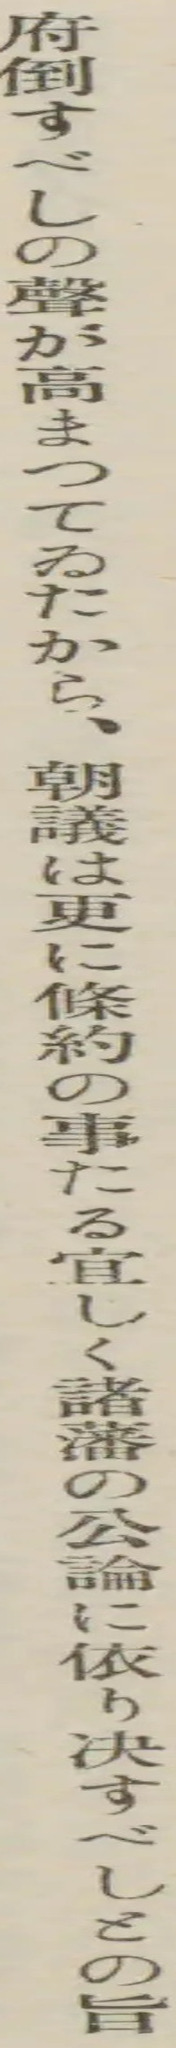府倒すべしの声が高まつてゐたから、朝議は更に条約の事たる宜しく諸藩の公論に依り決すべしとの旨
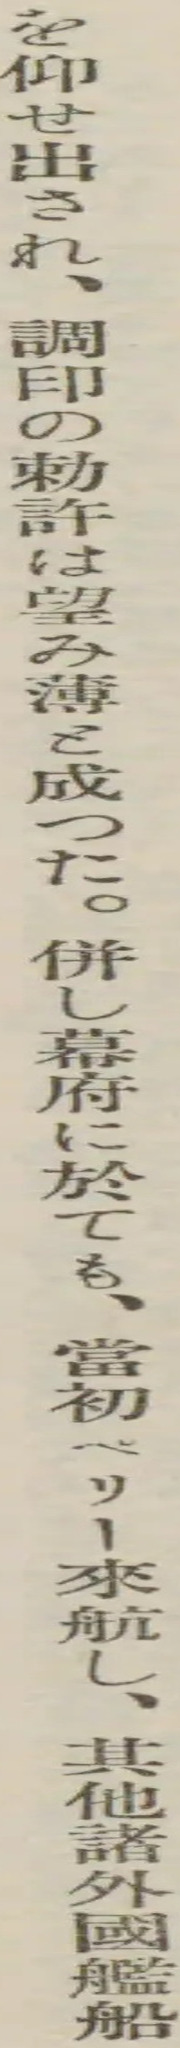を仰せ出され、調印の勅許は望み薄と成つた。併し幕府に於ても、当初ペリー来航し、其他諸外国艦船
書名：小野湖山翁小伝
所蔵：国立国会図書館 National Diet Library, JAPAN
